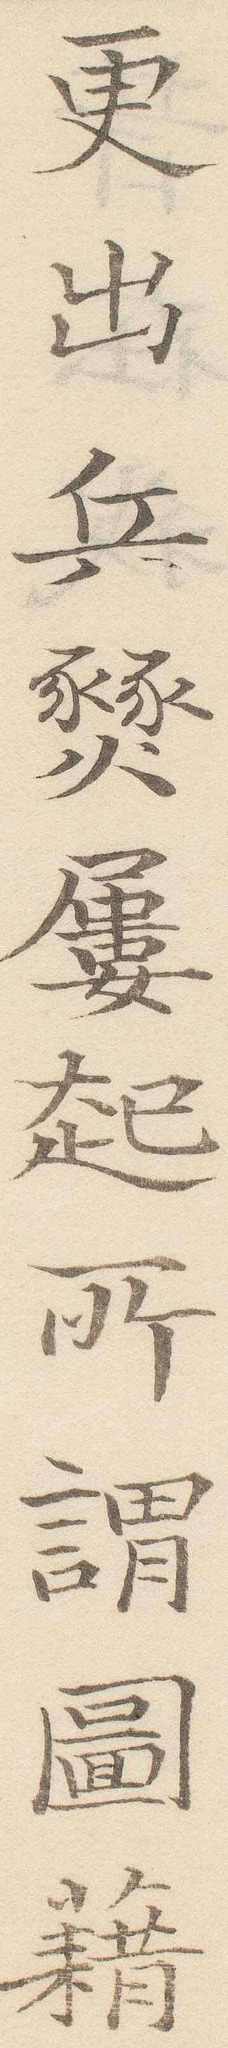更出兵燹屡起所謂図籍
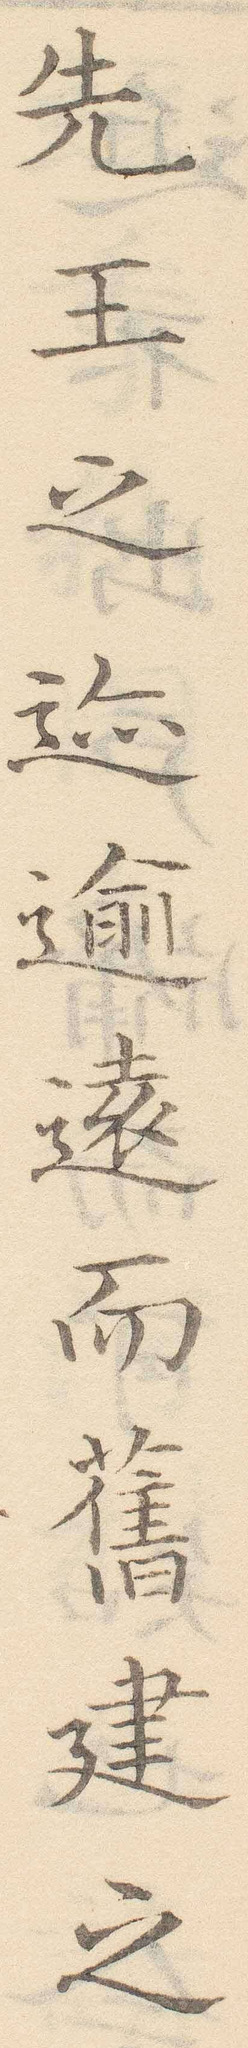先王之迹逾遠而旧建之
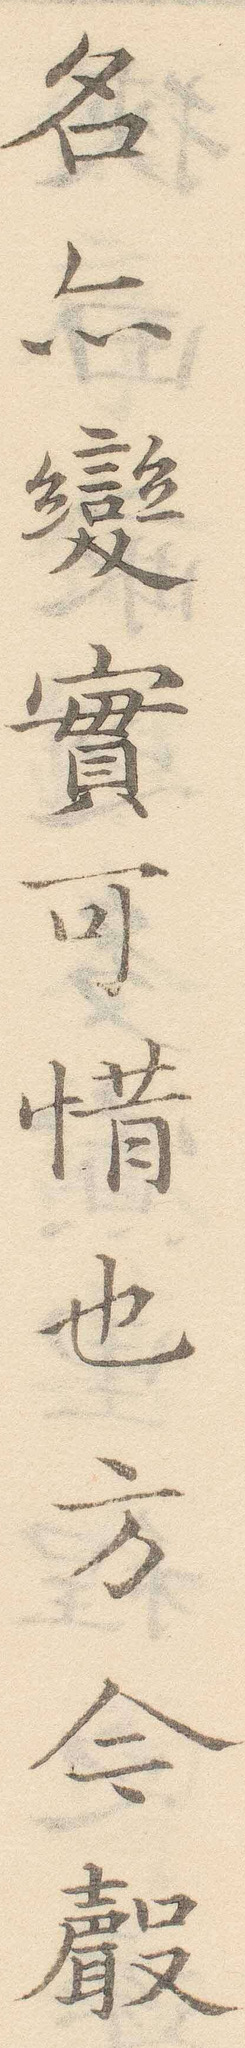名亦変実可惜也方今声
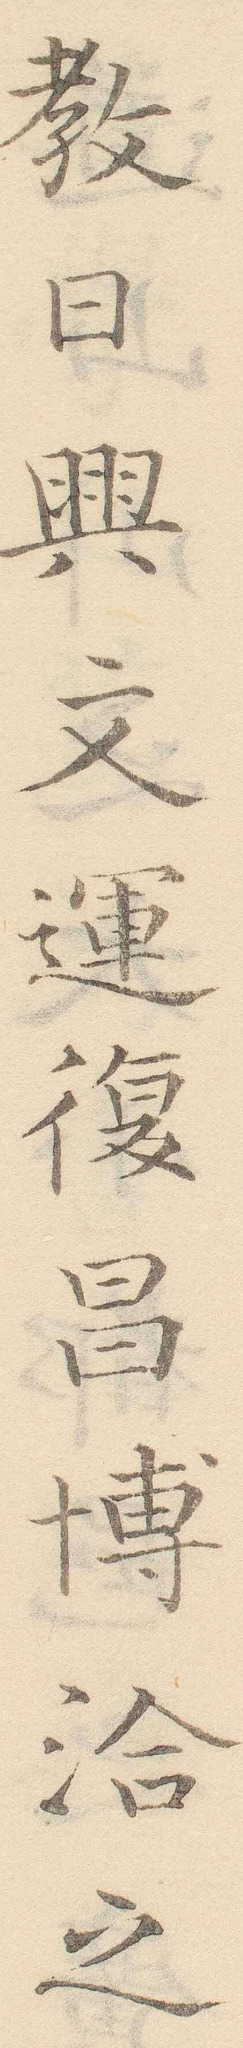教曰興文運復昌博洽之
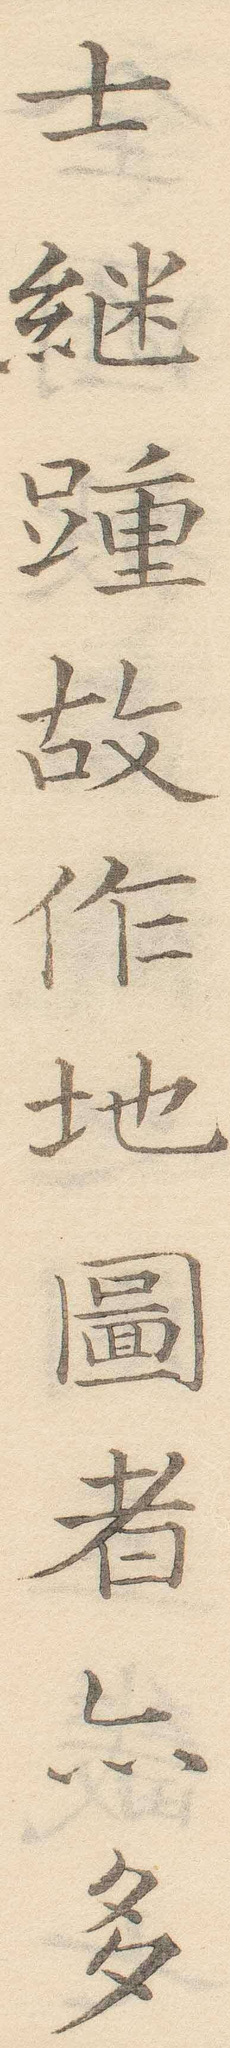士継踵故作地図者亦多
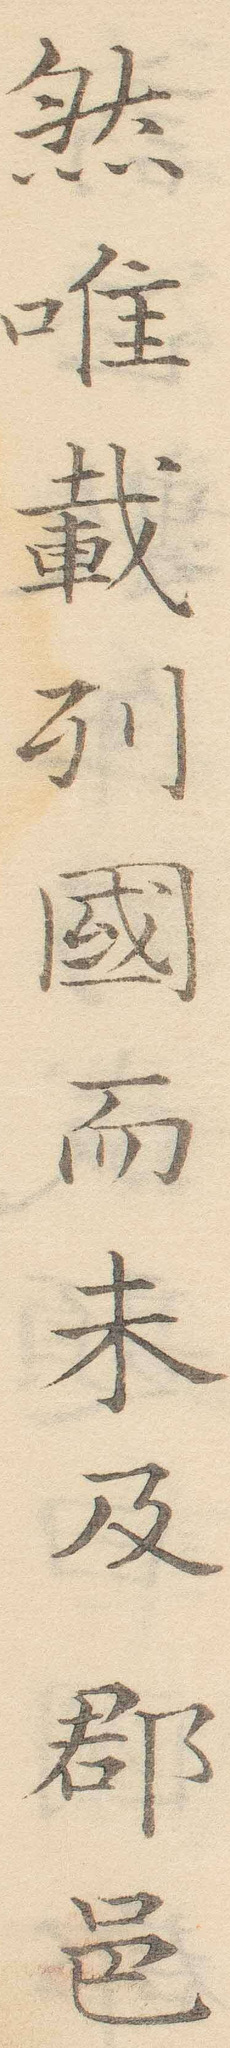然唯載列国而未及郡邑
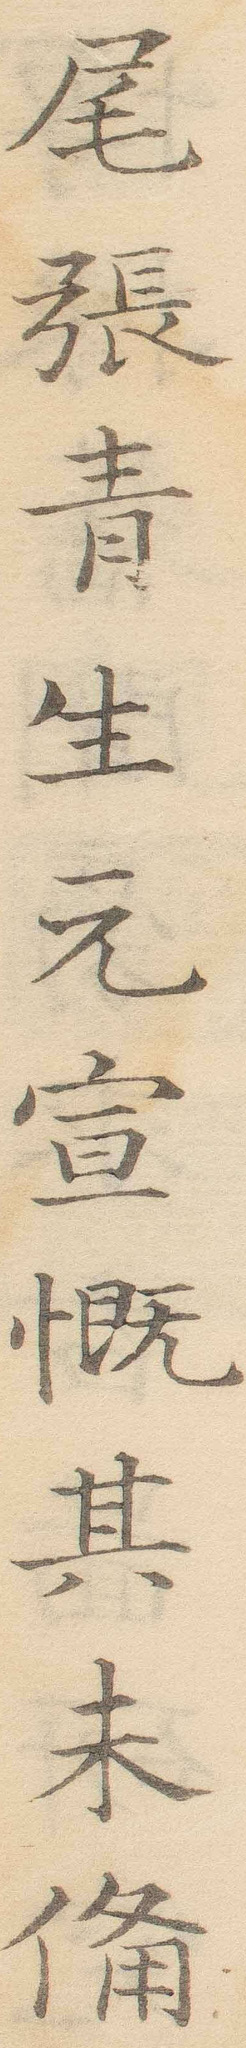尾張青生元宣慨其未備

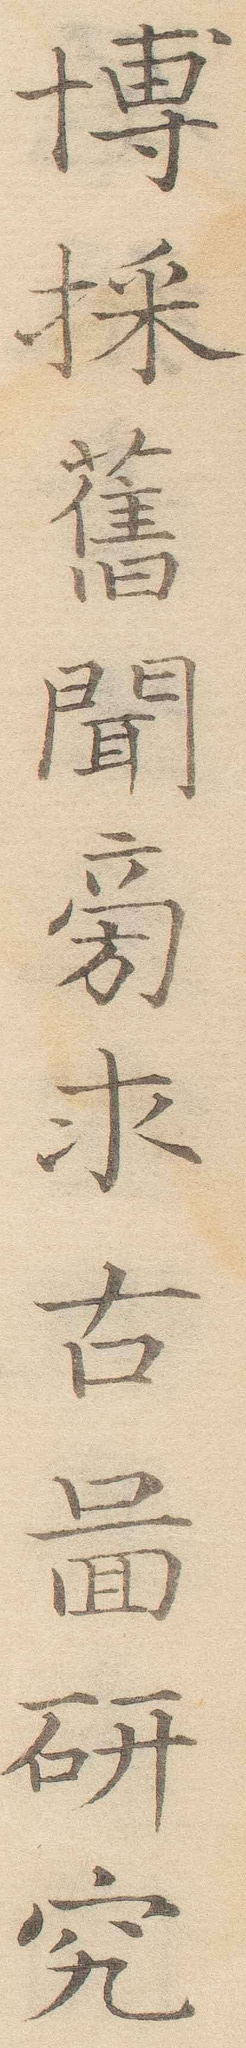博採旧聞旁求古図研究
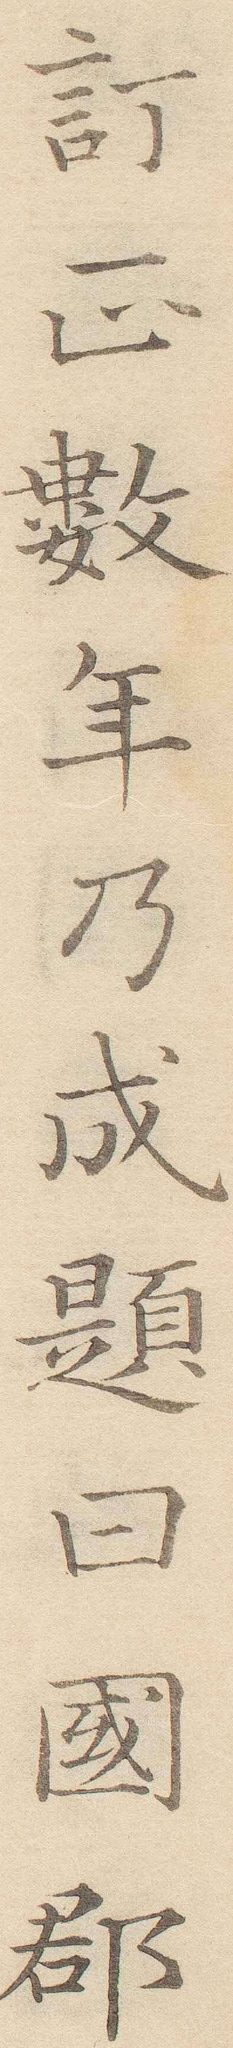訂正数年乃成題曰国郡
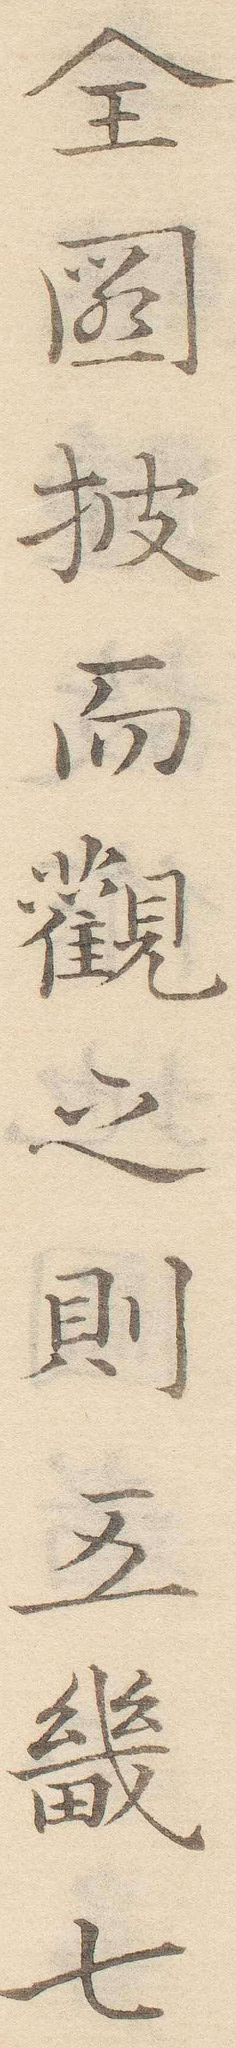全図披而観之則五畿七
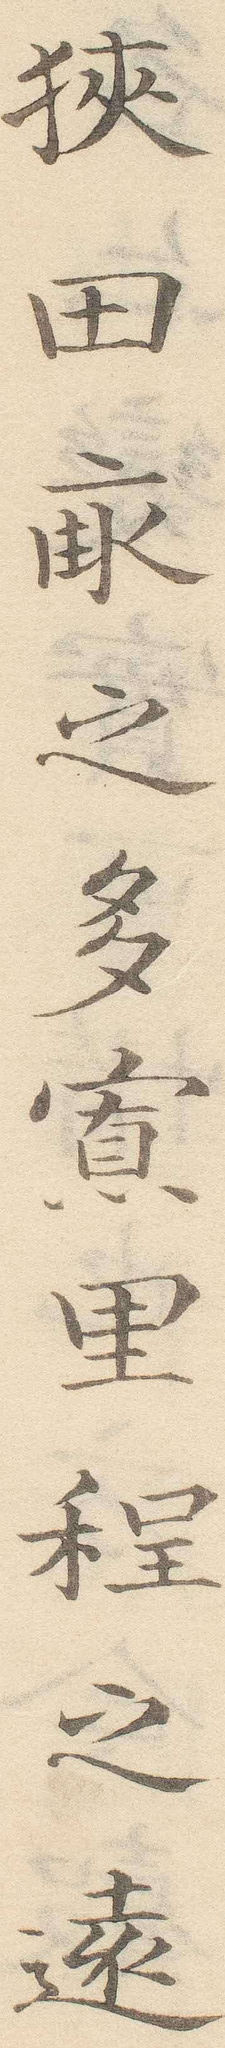狭田畝之多寡里程之遠
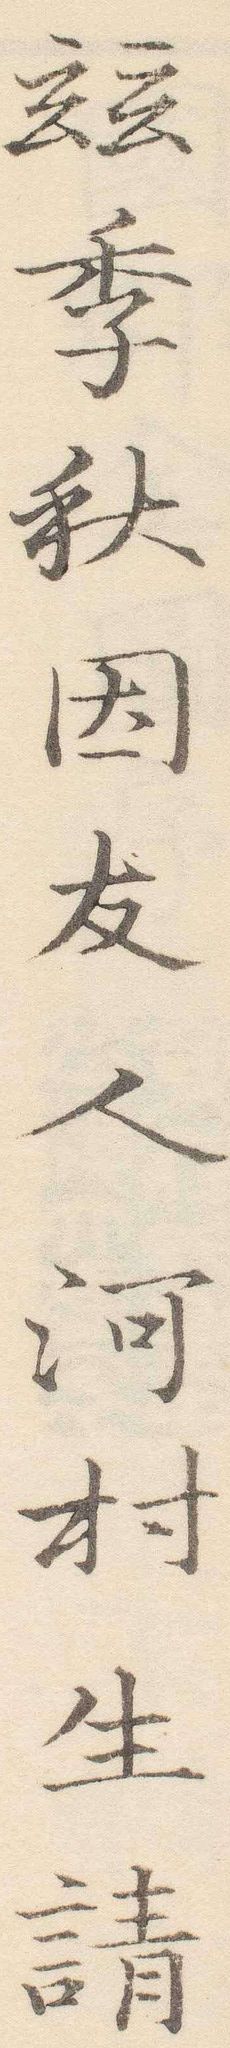玆季秋因友人河村生請
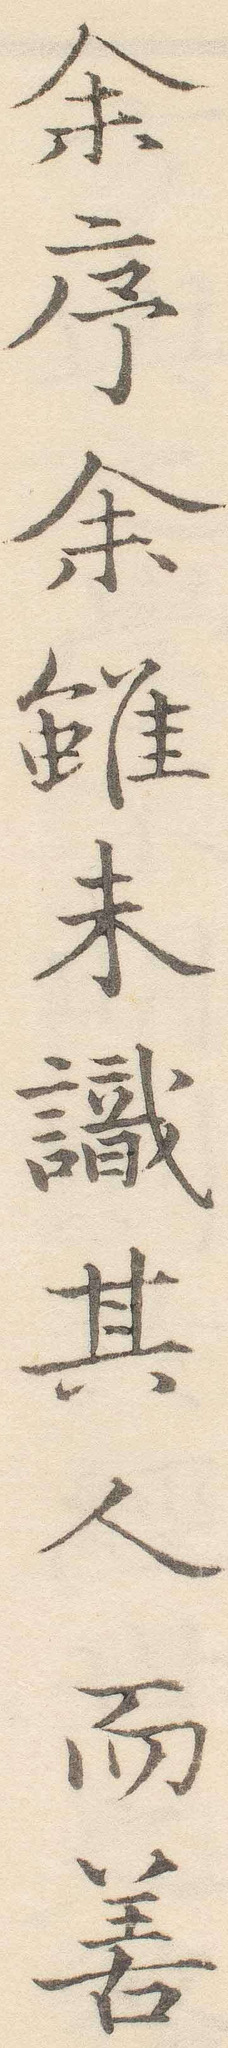余序余雖未識其人而善
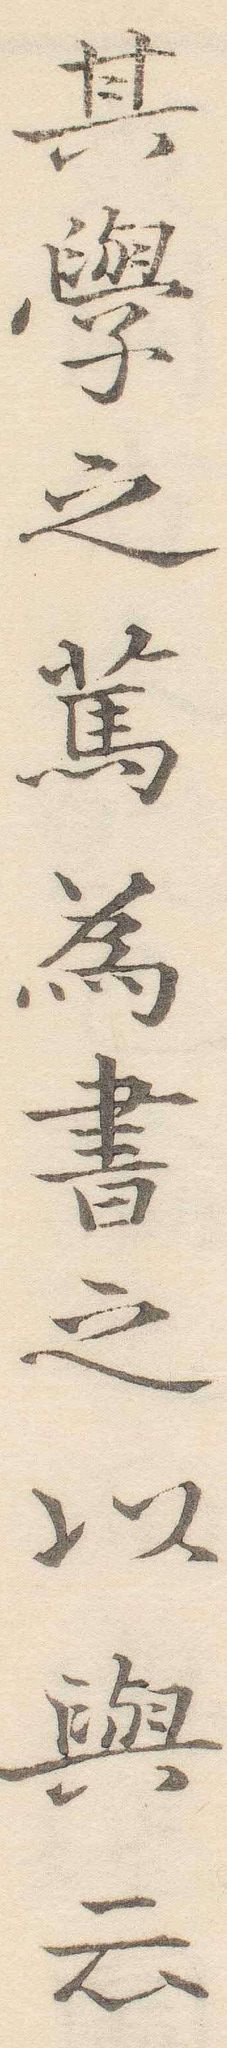其学之篤為書之以与云
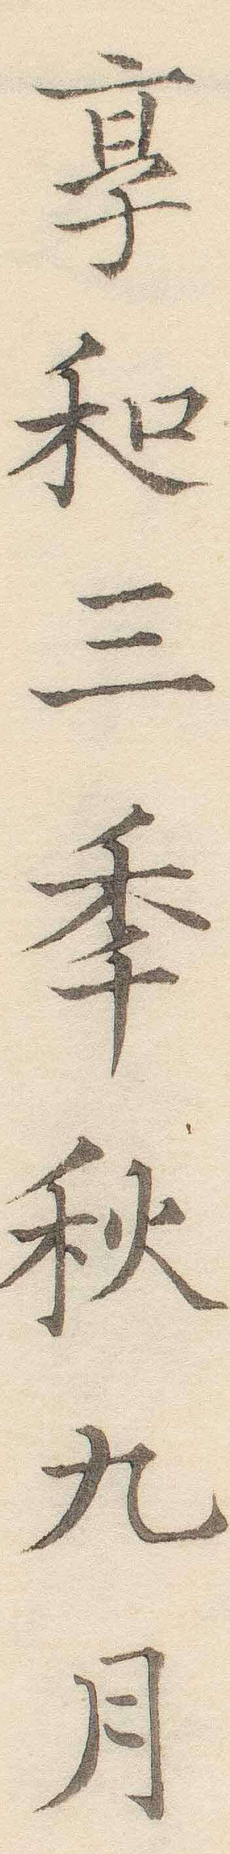享和三季秋九月
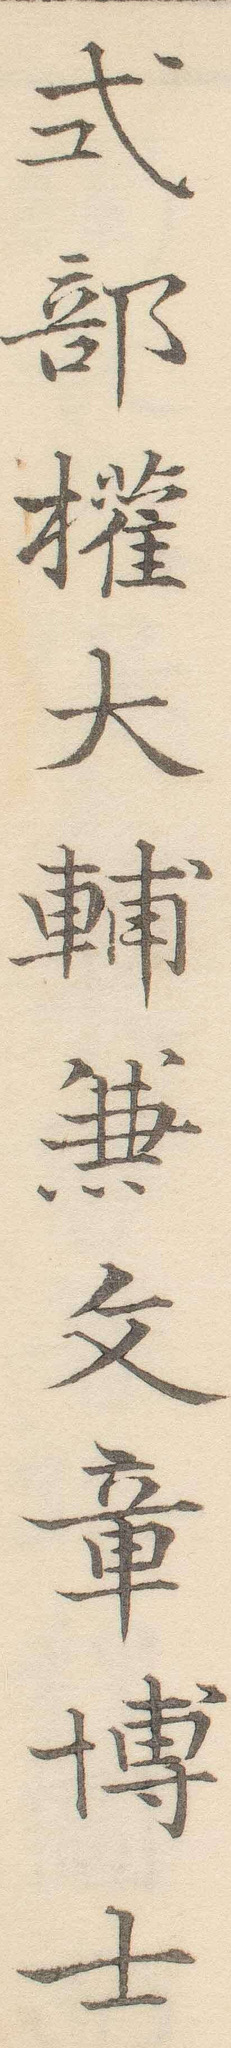式部権大輔兼文章博士
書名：国郡全図
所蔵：東京学芸大学附属図書館 国文学研究資料館
